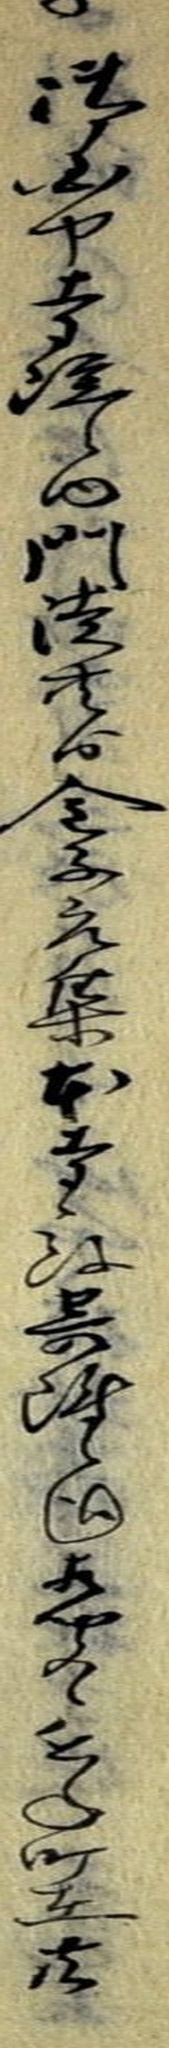○諸国中寺院之内門徒共ゟ金子取集本寺へ致寄附候趣相聞候近年町在共
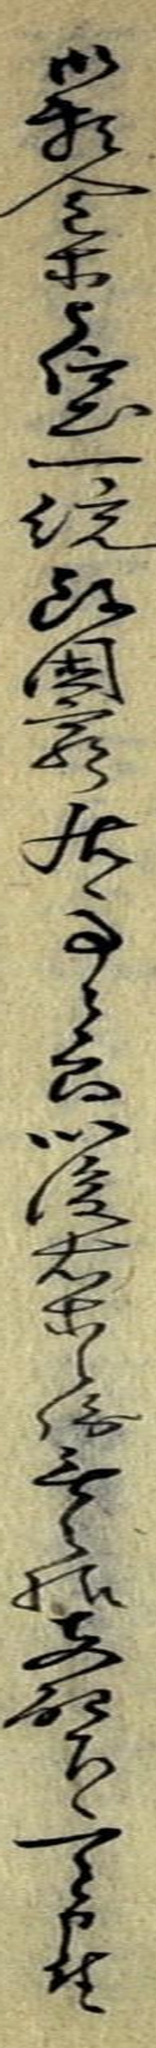御頼金等被仰出一統致困窮居候事ニ候間以後右等之儀無之様支配下へ可申付候
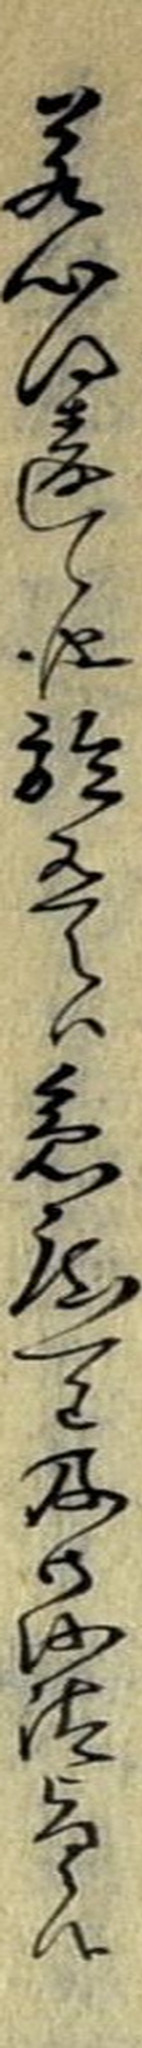若心得違之儀於有之ハ急度可及御沙汰旨ニ候
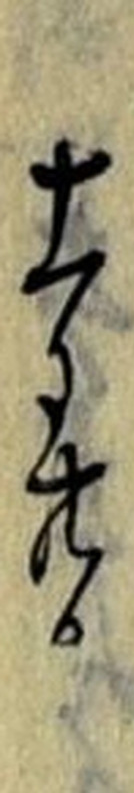十一月廿日
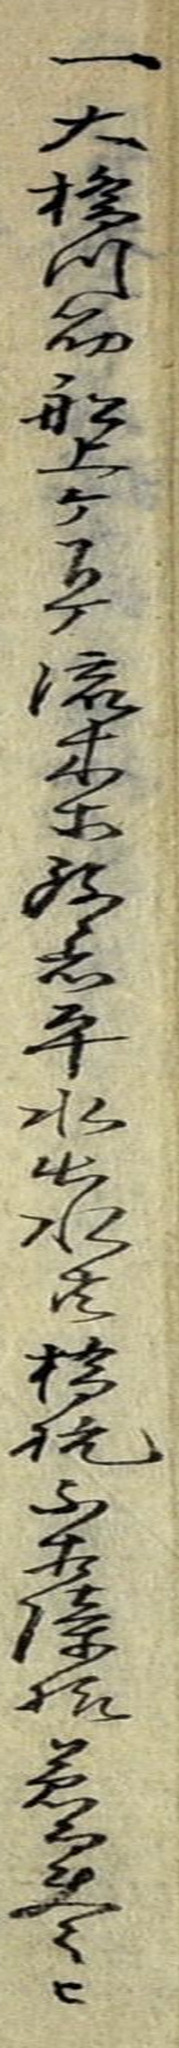一大橋川筋船上ケ下ケ流木等致候者平水出水共橋枕不相障様兼而夫々被
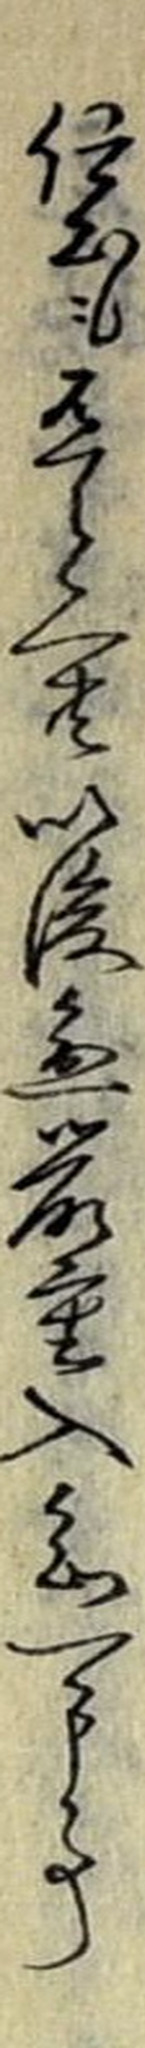仰出も有之へ共以後愈厳重入念可申事
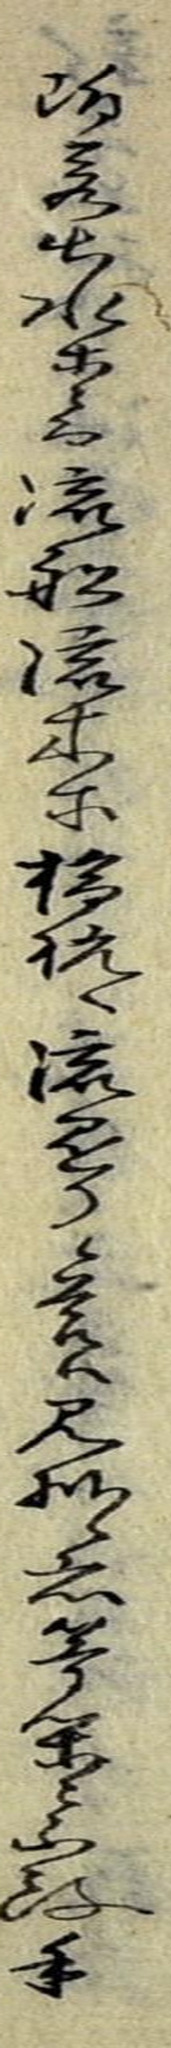附若出水等ニ而流船流木等橋枕へ流懸り候節ハ見掛候者等閑ニ不致手
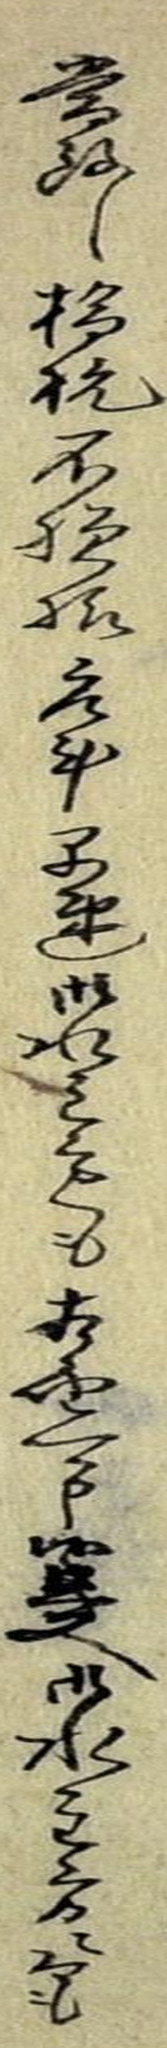当致し橋枕不損様取計早速御水主方へも相届可申候且又御水主方ニ而も
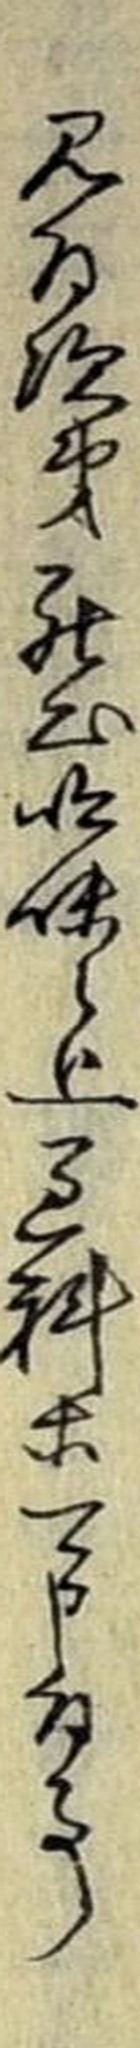見付次第罷出吟味之上過料等可申付事
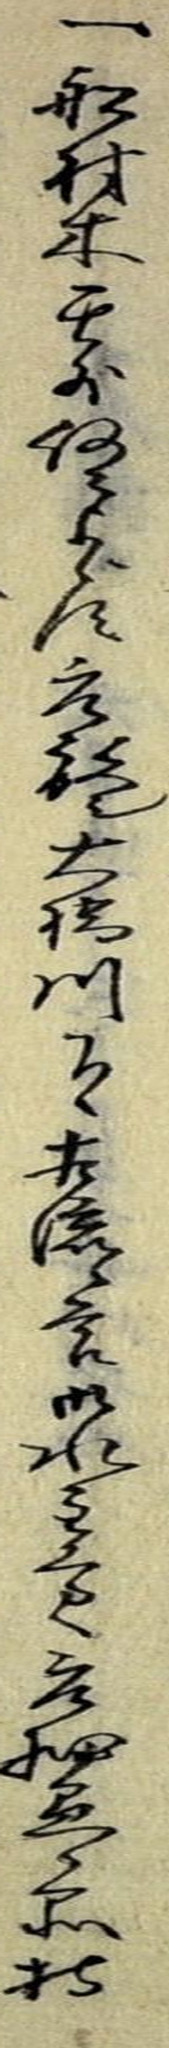一船材木其外何ニよらす取放シ大橋川下へ相流候節御水主方へ取押置候品持
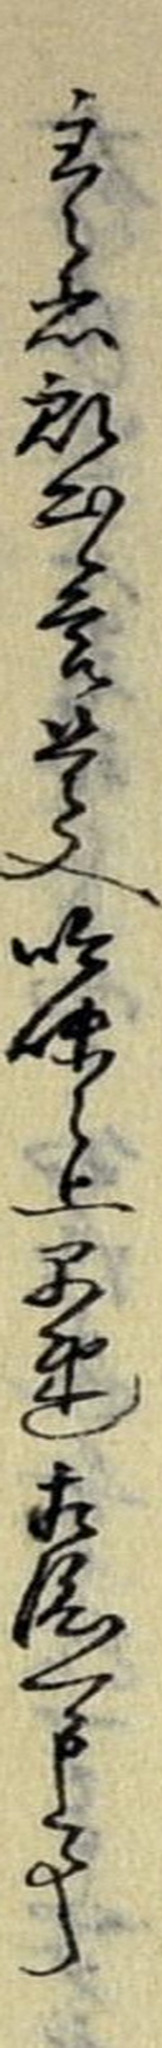主之者願出候節是又吟味之上早速相渡可申事
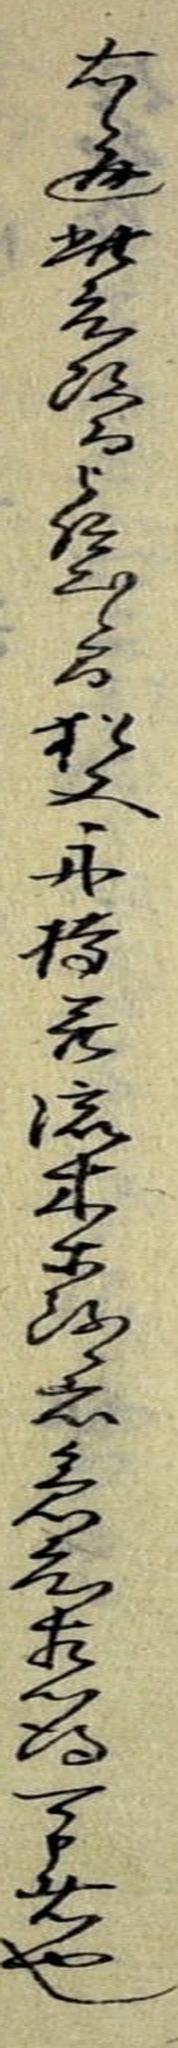右之通此度改而被仰出候間猶又舟持并流木等致候者急度相心得可申者也
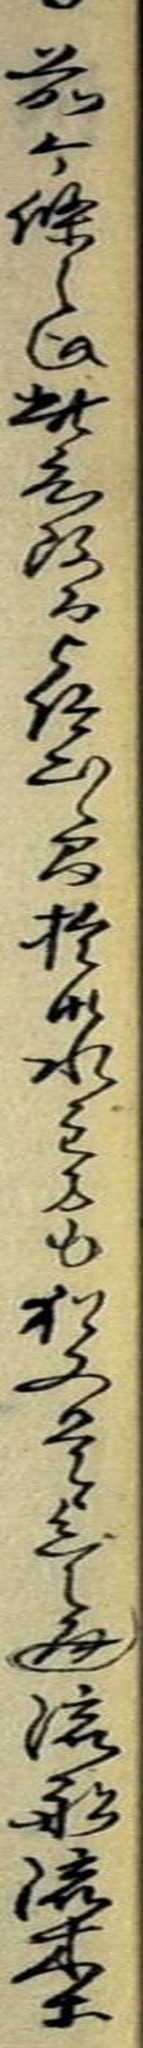○前ケ条之趣此度改而仰出候間於御水主方も猶又是迄之通流船流木等
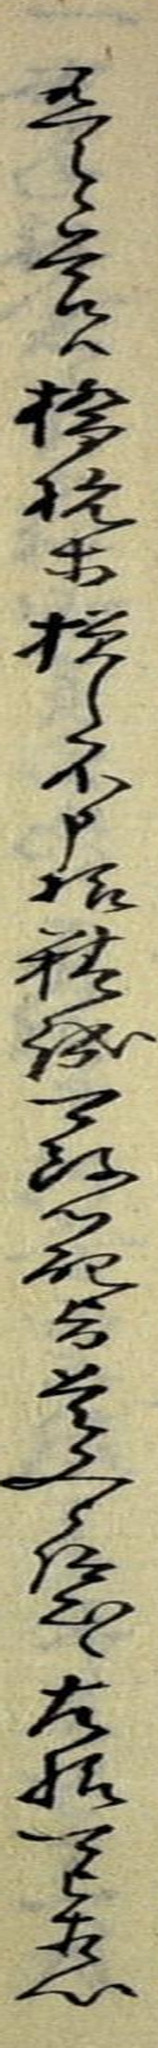有之候節ハ橋枕等損し不申様精誠可致心配旨是又被仰出候左様可被相心
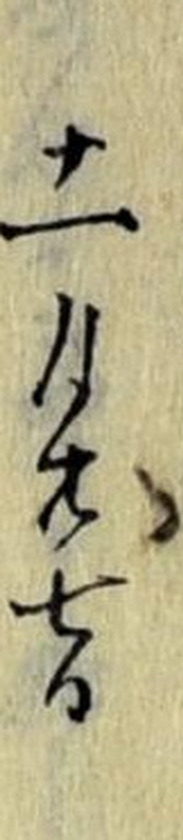十一月廿七日
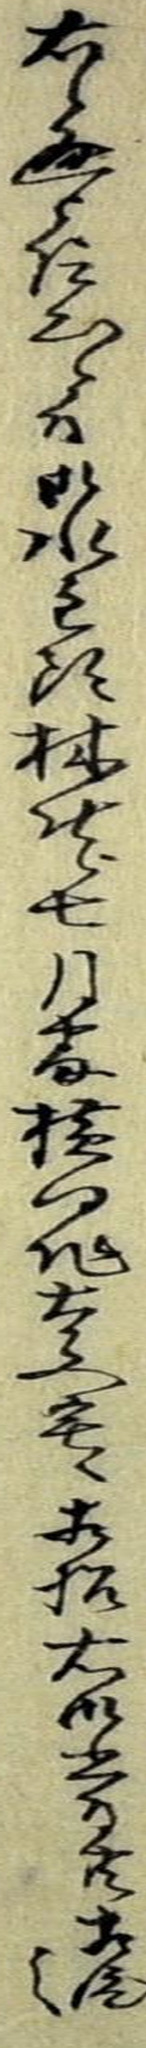右之通被仰出候ニ付御水主頭林次郎七月番横田作太夫宅へ相招右御書付共相渡之
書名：命令之部 五
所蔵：福井県文書館 Fukui Prefectural Archives
